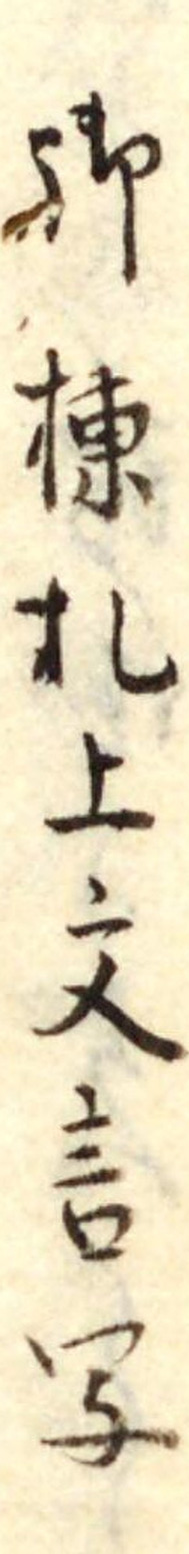御棟札上文言写
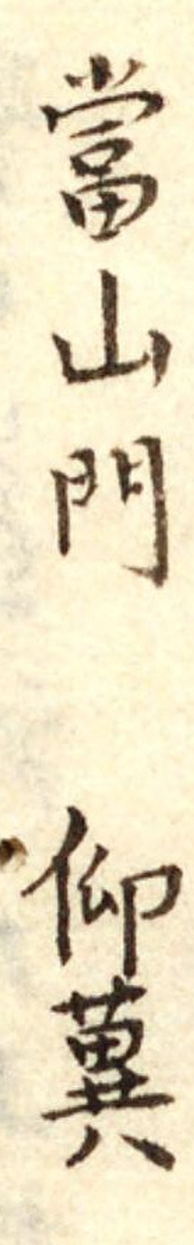当山門仰䔬
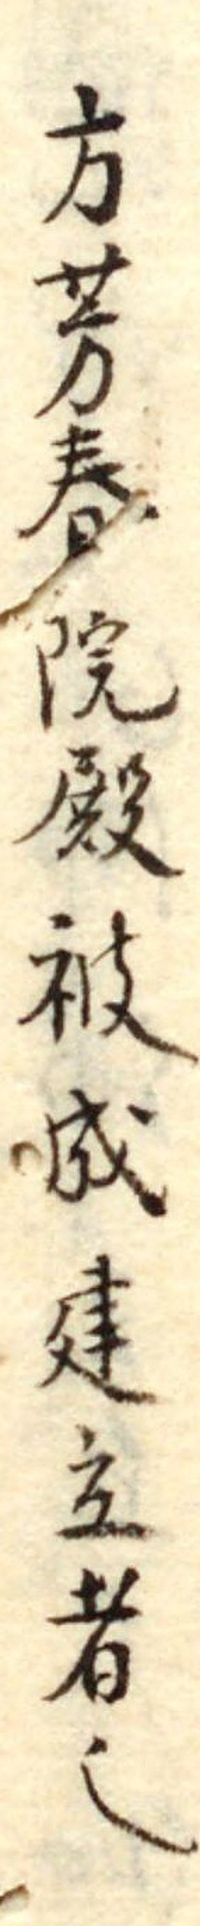方芳春院殿被成建立也
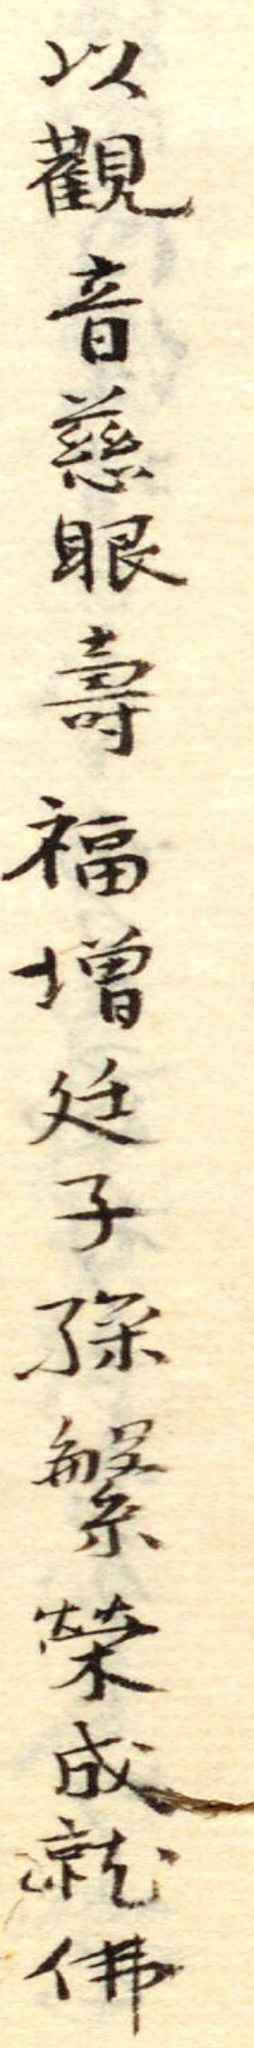以観音慈眼寿福増廷子孫繁栄成就仏
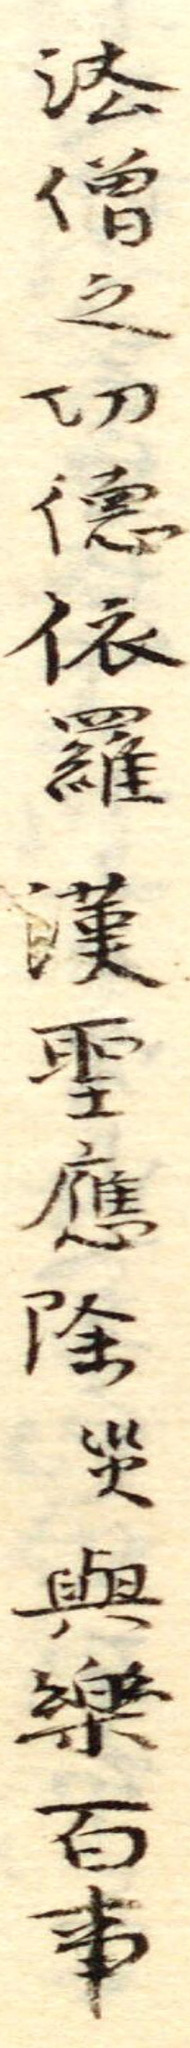法僧之功徳依羅漢聖応除災與楽百事
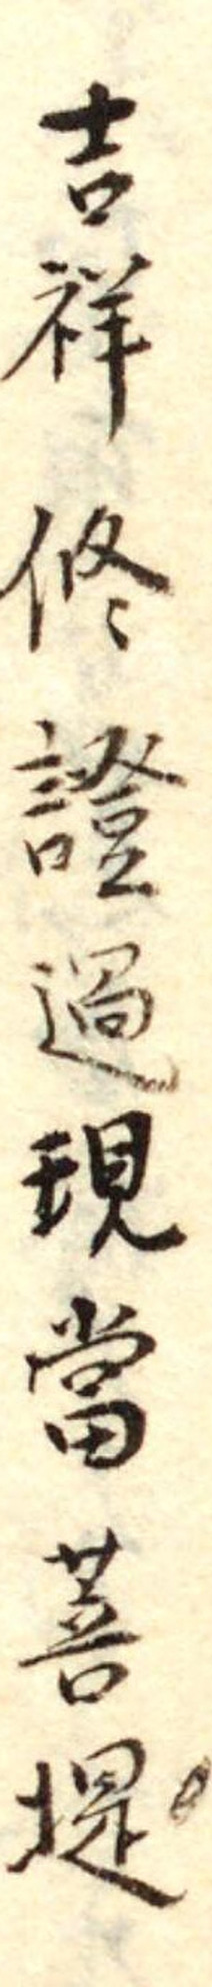吉祥修證過現当菩提
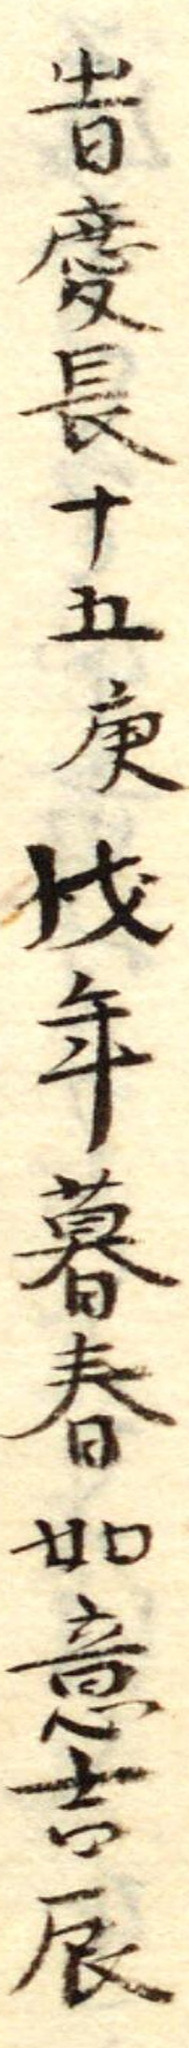旹慶長十五庚戊年暮春如意吉辰
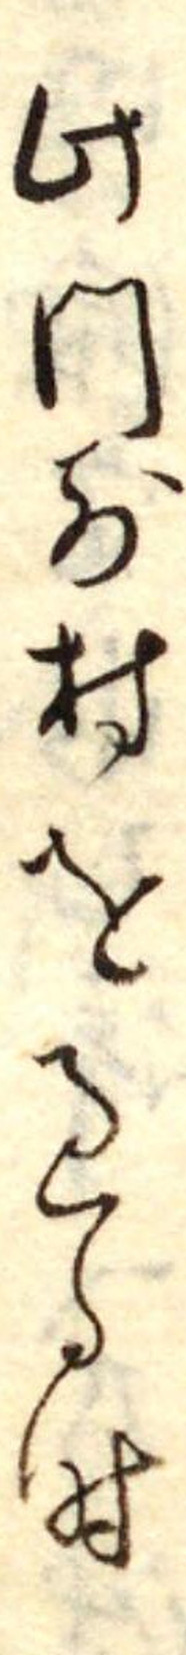此門前村を過る時
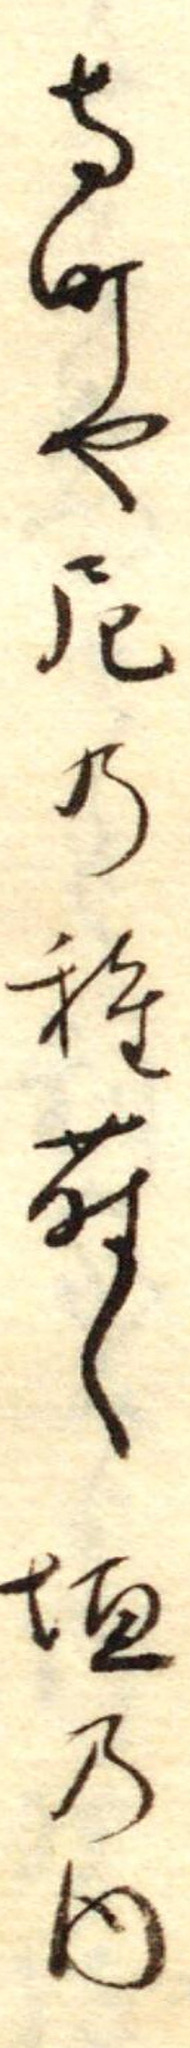寺町や尼の種蒔く垣の内

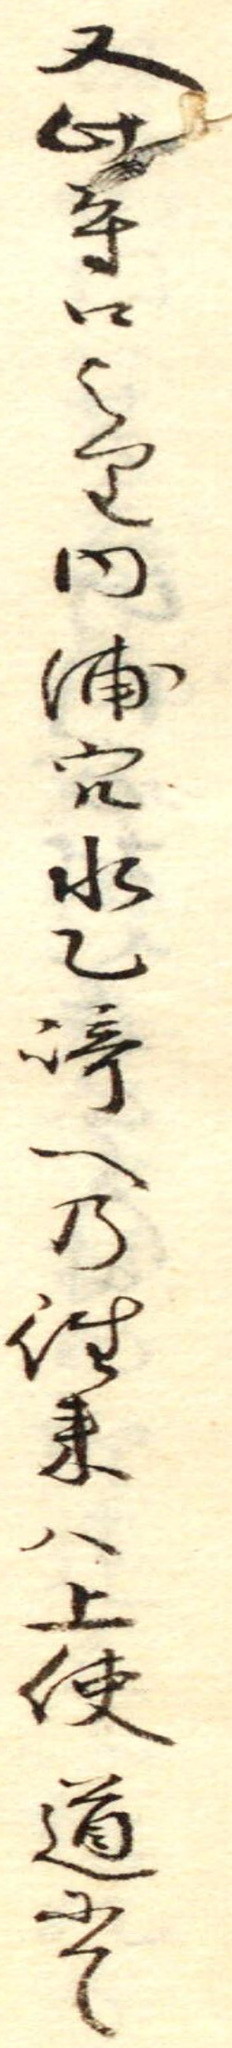又此寺口より内浦穴水乙崎への往来は上使道にて
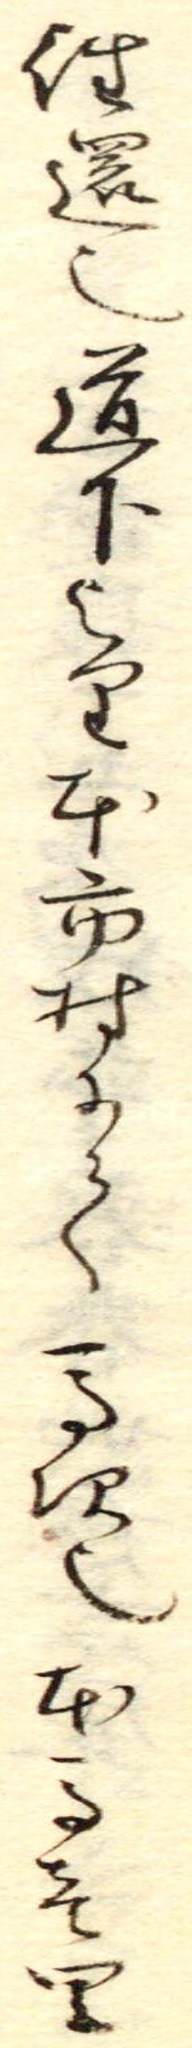往還也道下より本市村にて馬次也本馬壱里
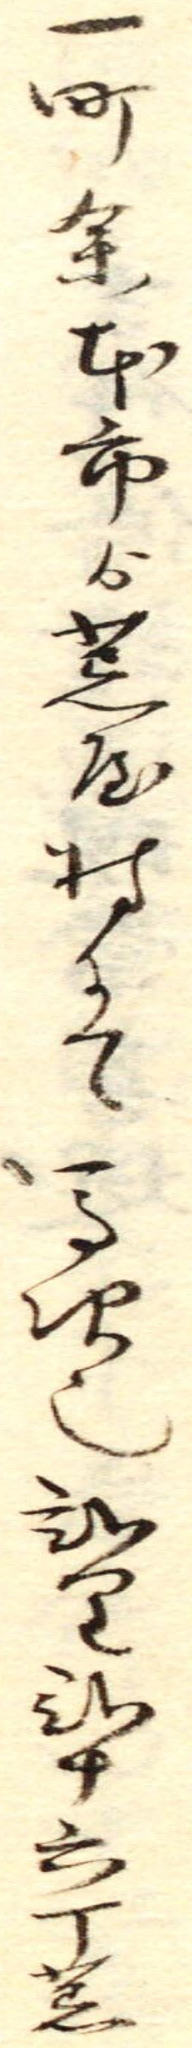一町余本市ゟ荒屋村にて馬次也弐里弐十六丁荒
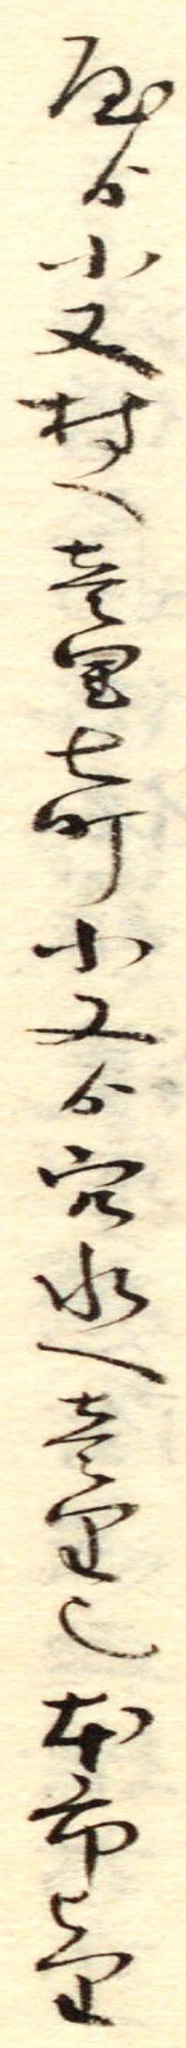屋ゟ小又村へ壱里七町小又ゟ穴水へ壱里也本市より
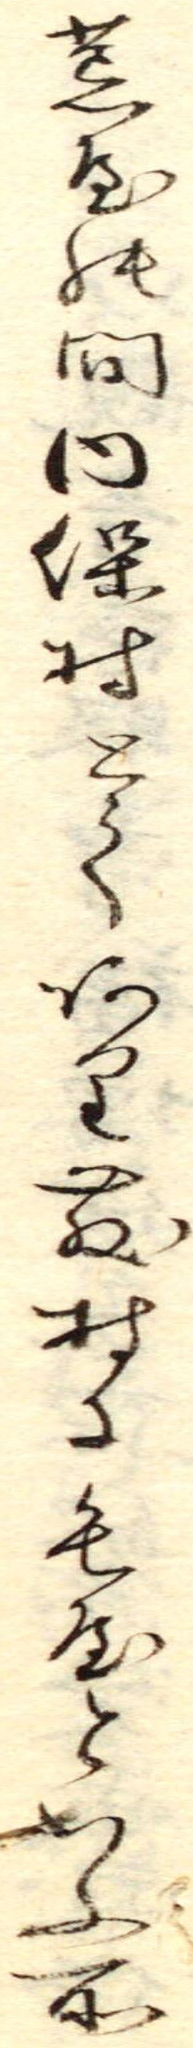荒屋の間内保村とてあり散村に毛屋といふ所
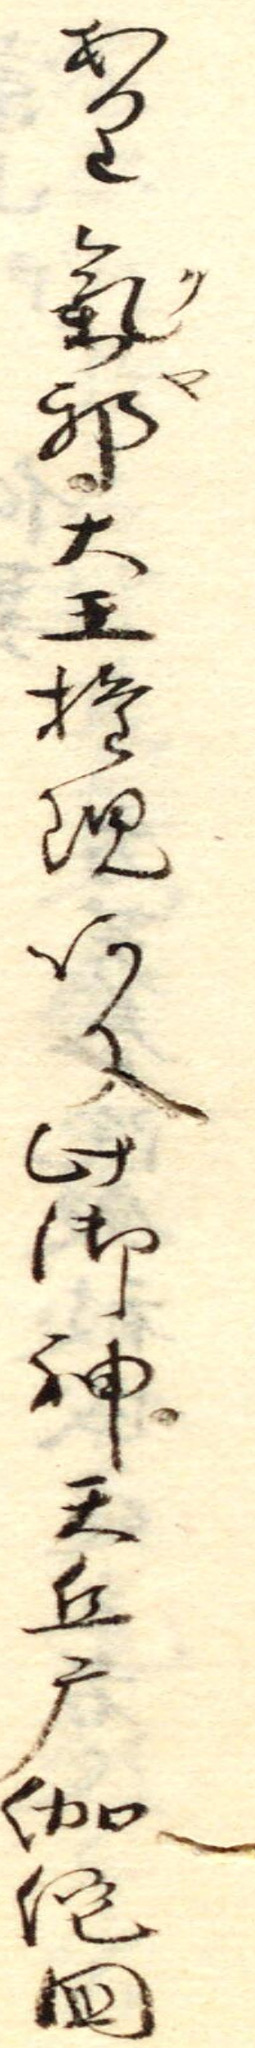あり気邪大王権現あり此御神天丘磨伽佗国
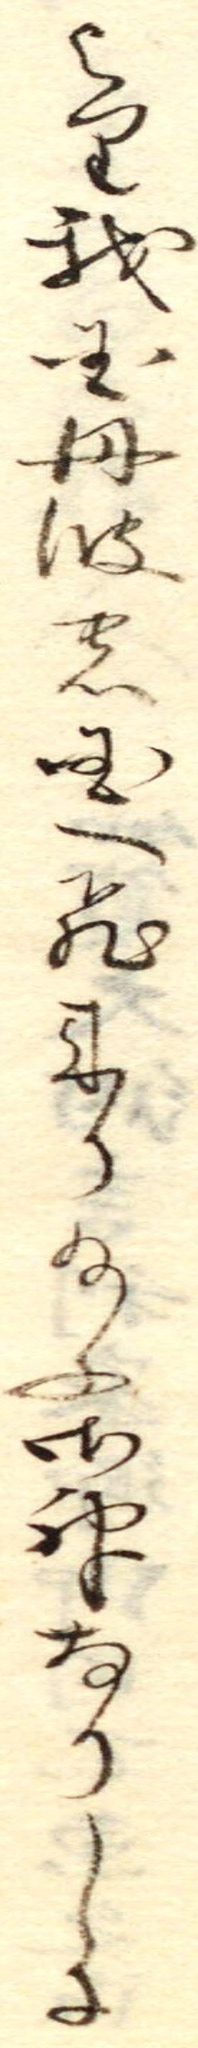より我国丹波の国へ飛来り給ふ御神なりしに
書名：能登名跡誌
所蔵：Ishikawa Prefectural Library
